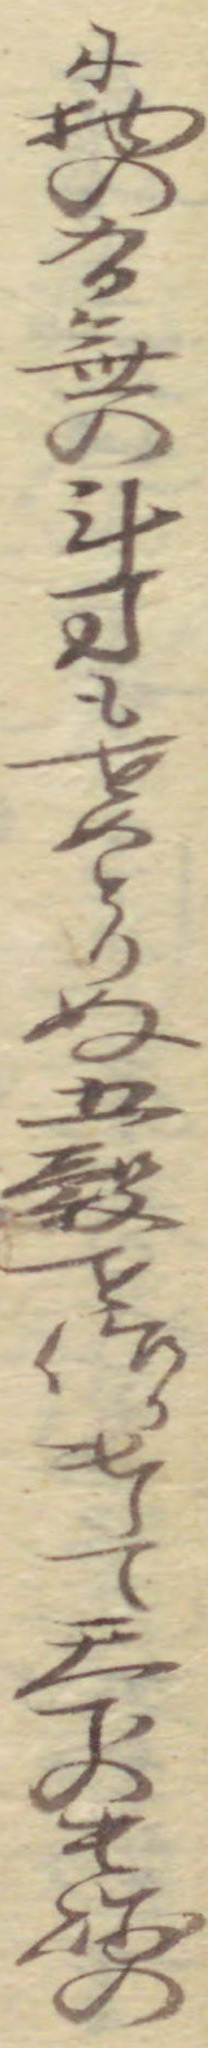に物の有無の計方もせめとりぬ五穀を作り出して天下の貴賎の
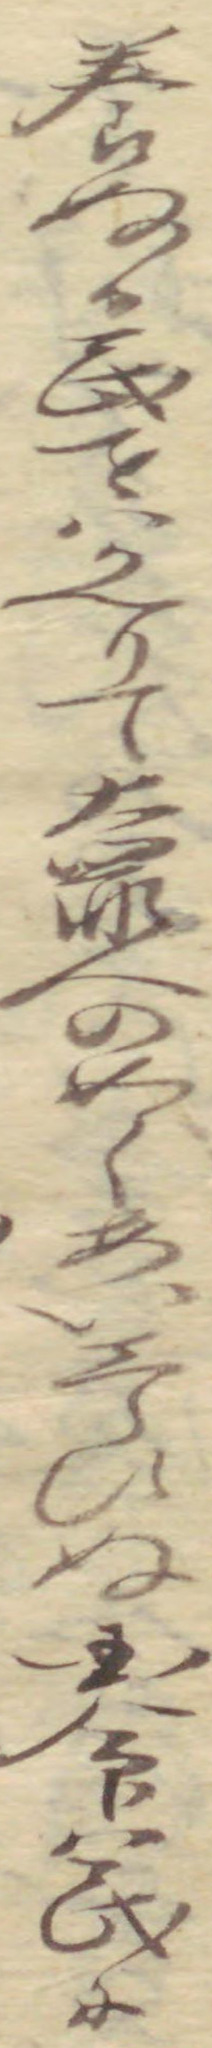養ぬる民をはかへりて大罪人の如くあいしらひぬ国命は民に
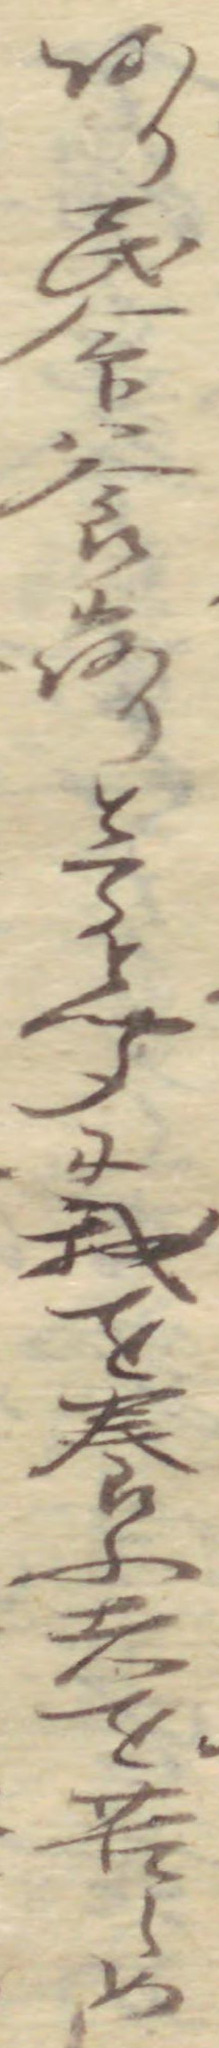あり民命は食にありとこそ聞に我を養ふ者を苦しめ
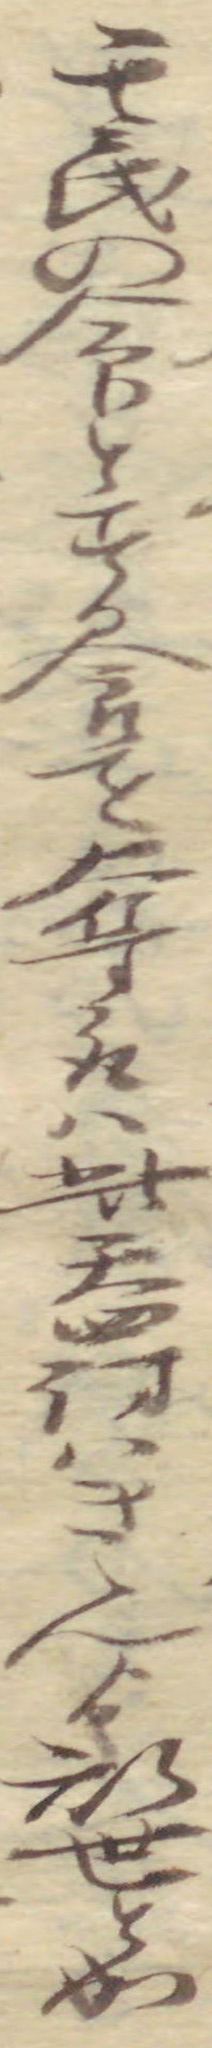其民の命とする食を奪取は此天罰はきゝんゟ乱世と成
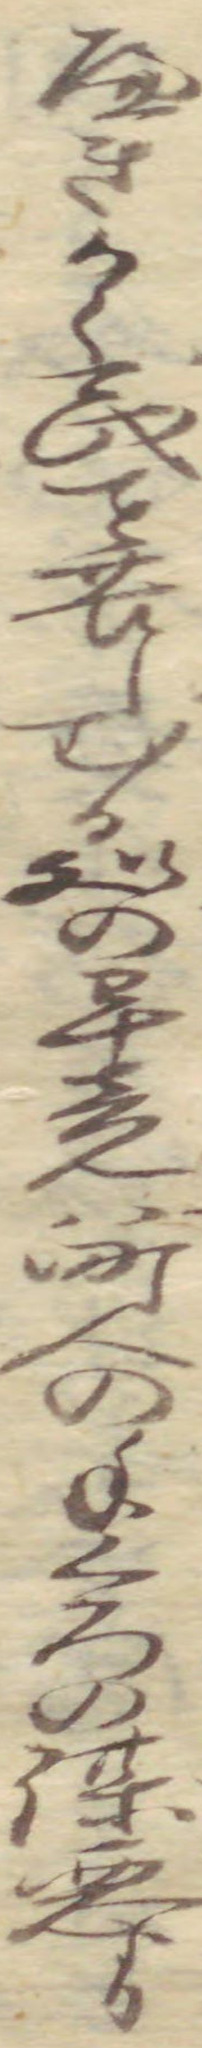へきかく民を苦しむる処の畢竟は町人の手くろの謀悪より
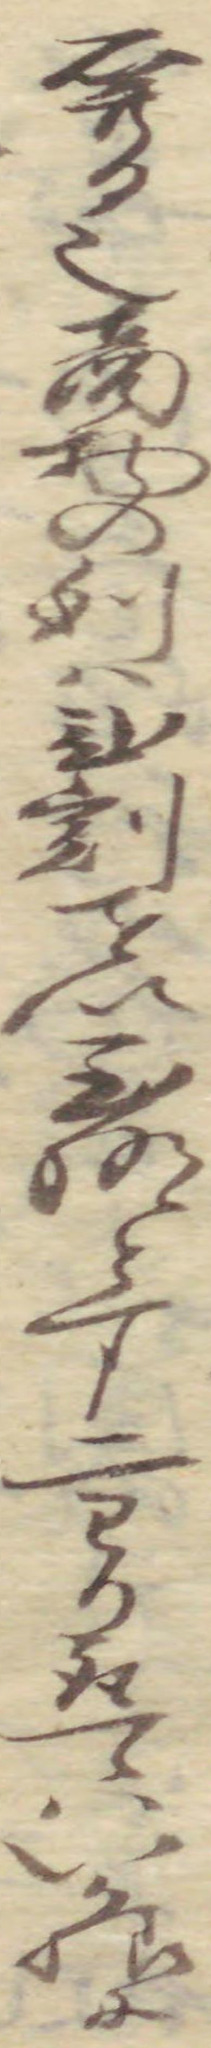発る也商物の利は弐割を以至極とす二わり取てはいか様に
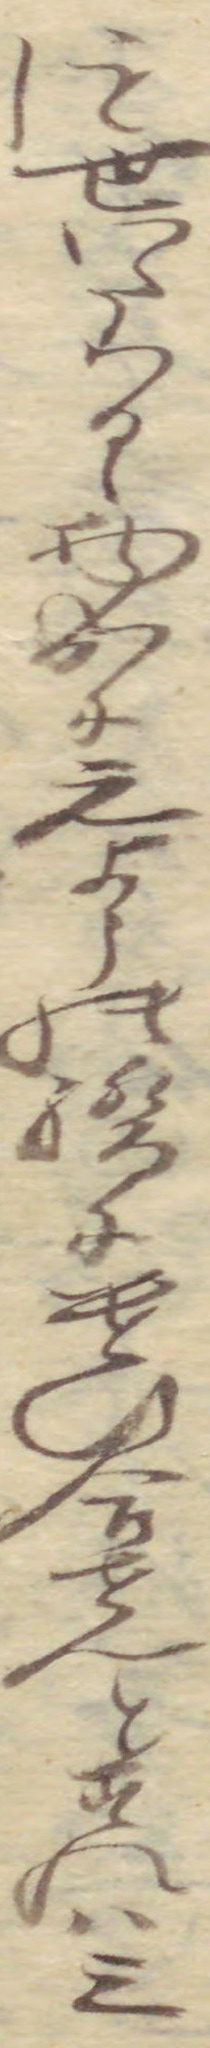も世わたらるゝ物成にえようの驕に遣ひ合せんとすれは三
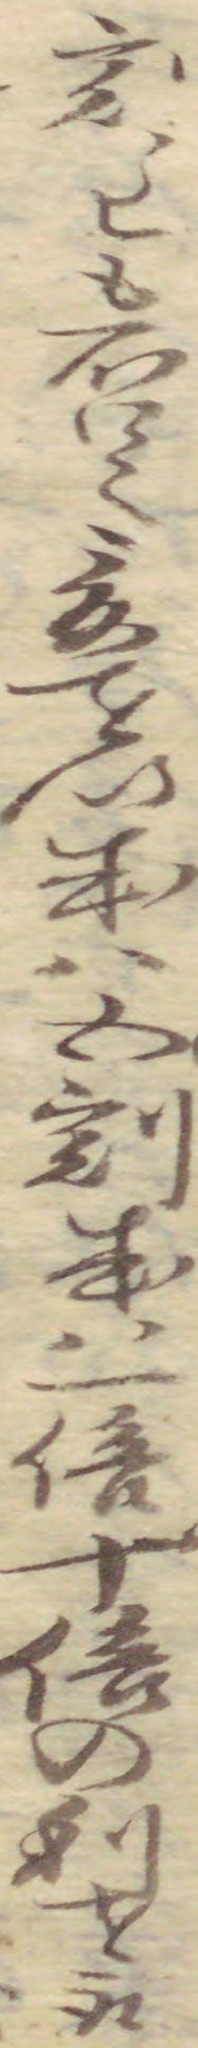割ニても不足爰を以或は五割或は一倍十倍の利を取
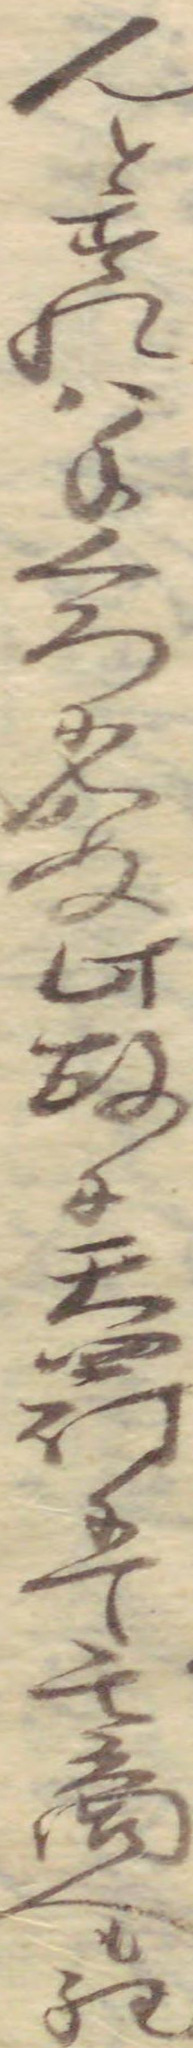んとすれは手くろに成ぬ此故に天罰にてその商人も程
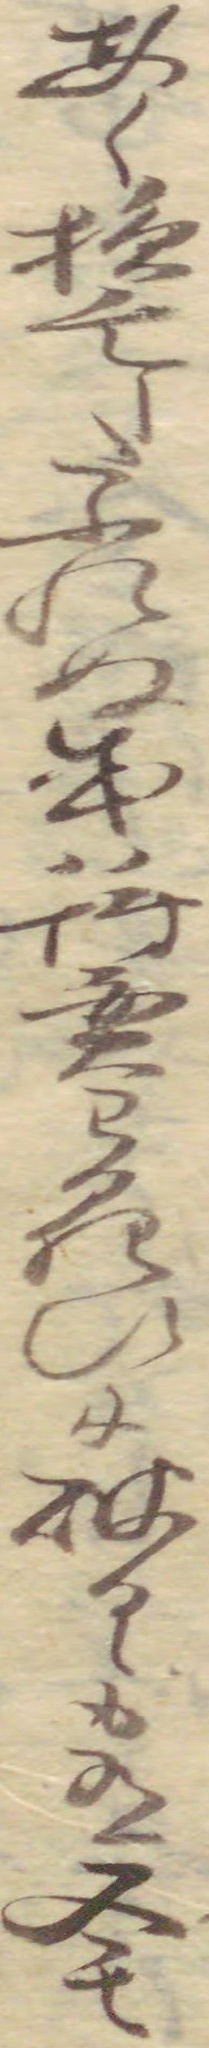なく損亡したふれぬ或は博奕わる狂ひに破るゝも有又其
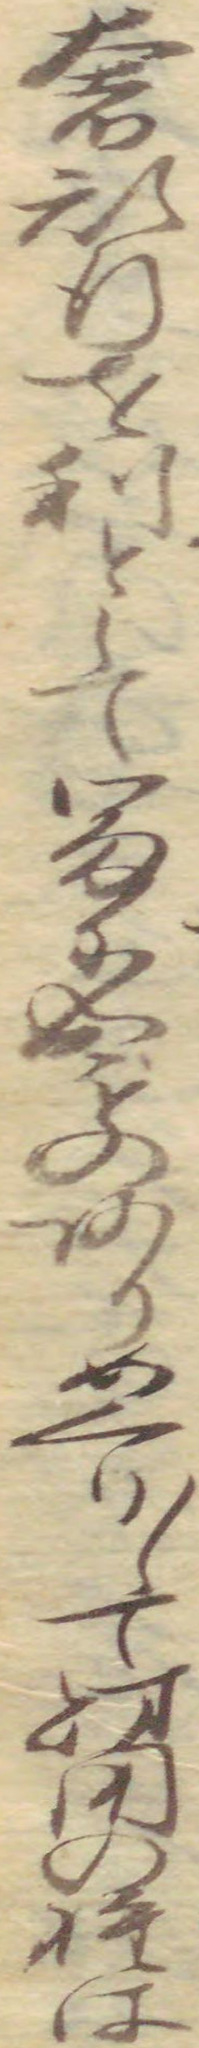奢乱行を利として富に成ものありめくり〳〵て財用の権は

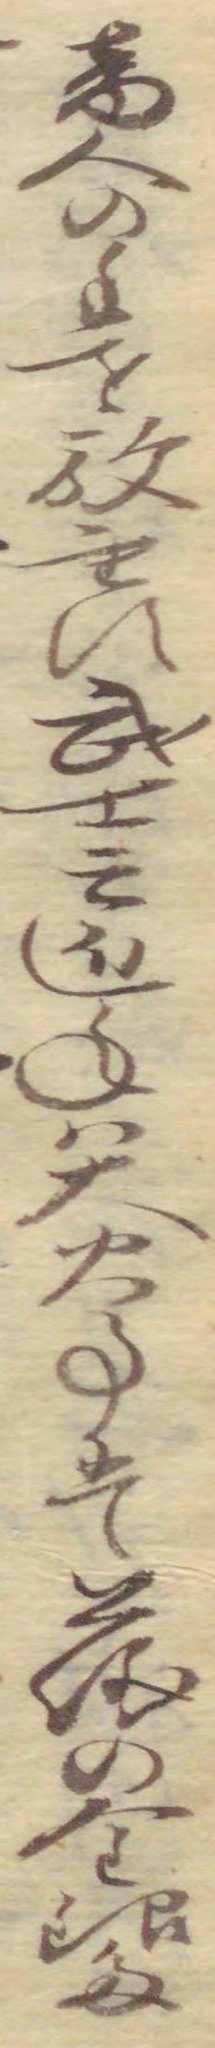商人の手を放れす武士云近年は大火事にて公儀の金銀多
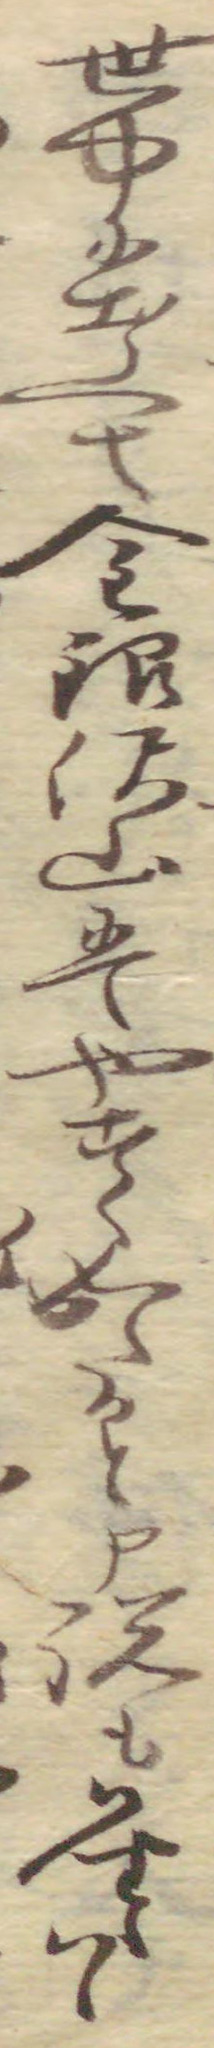世中に出候へは金銀沢山にてやすく成たると申説も御座候はゝ
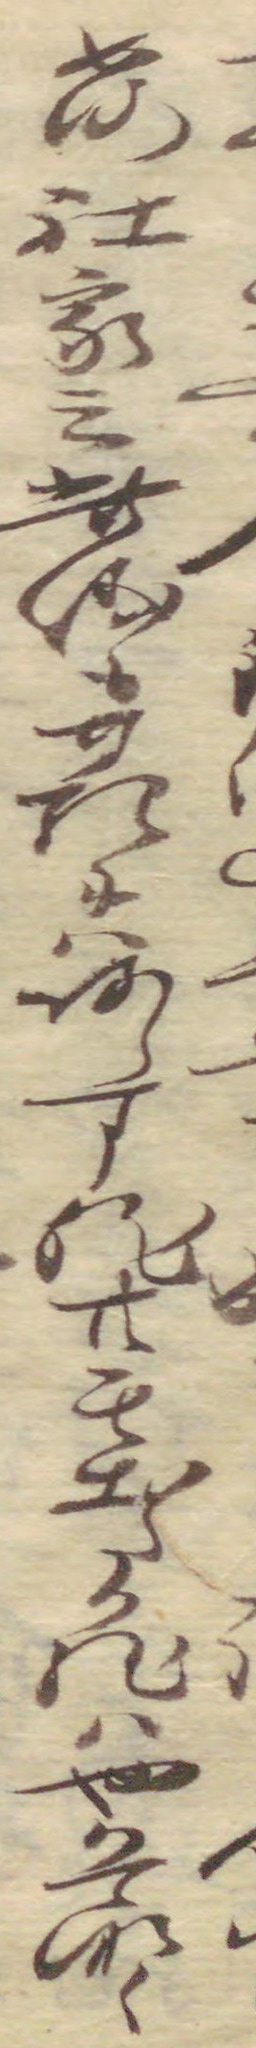如何社家云此儀もなきにはあらす然共其出たる程はやかてなく
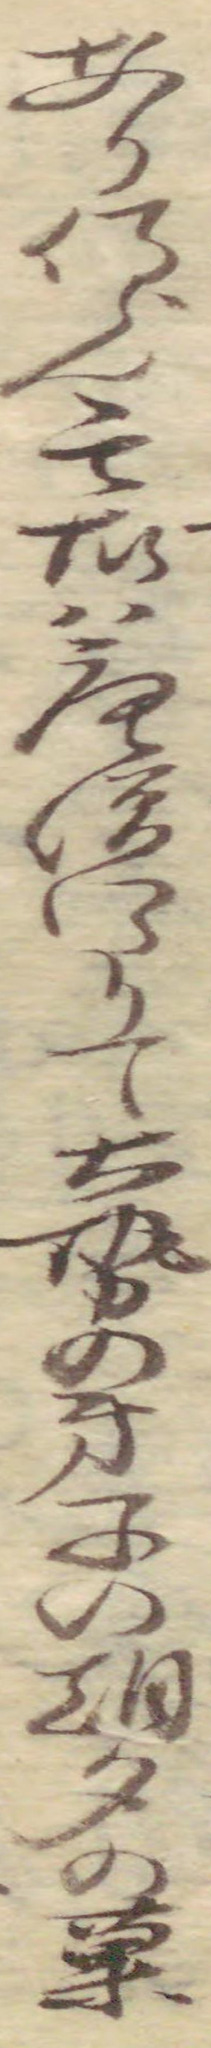なり侍らん其故は唐僧わたりて大勢の弟子の朝夕の菓
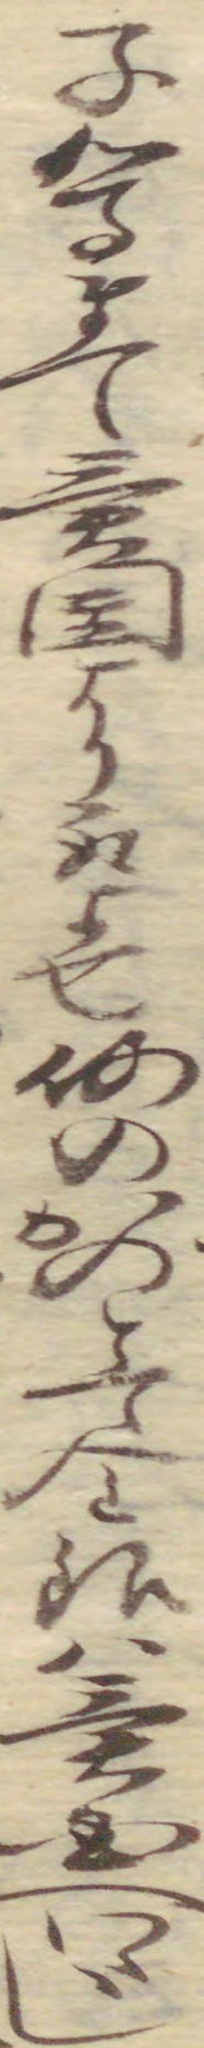子等まて異国より取よせ何のかのとて金銀は異国へわたし
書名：鶯宿雑記. 巻263-264
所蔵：国立国会図書館 National Diet Library, JAPAN
